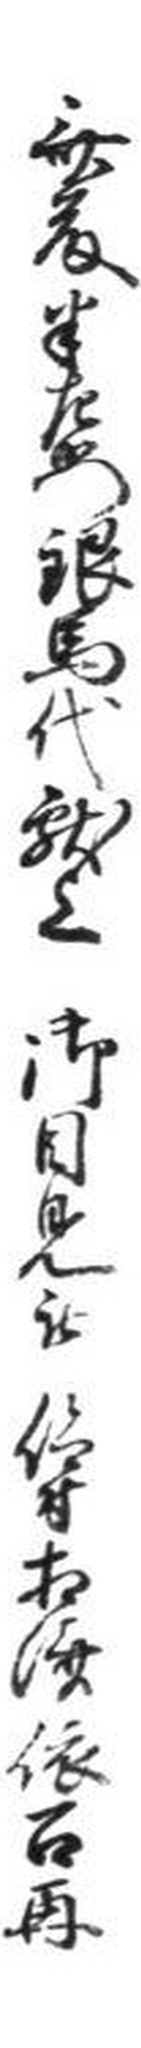斎藤半左衛門銀馬代献上御目見被仰付相済依召再
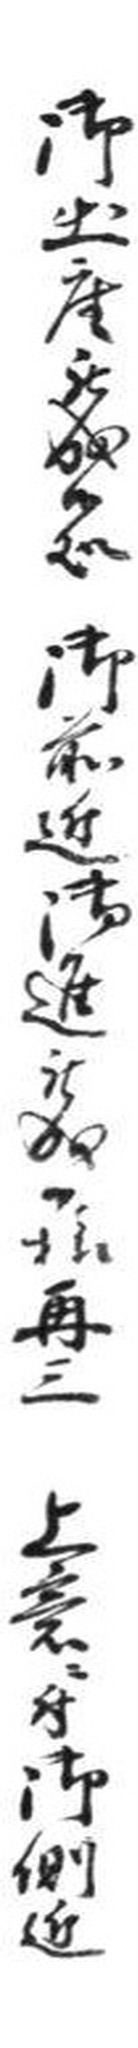御出座被成候処御前近御進被成候様再三上意ニ付御側近
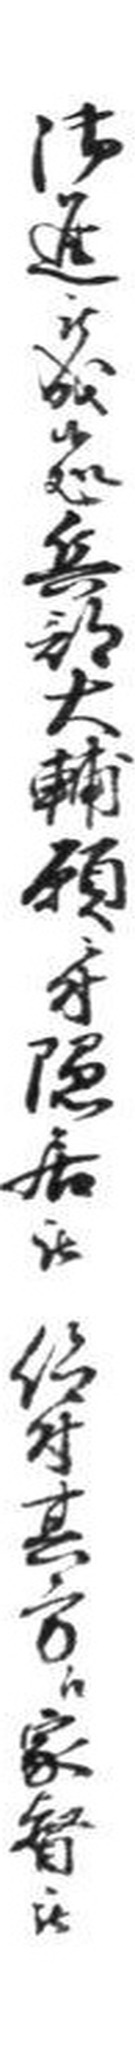御進被成候処兵部大輔願ニ付隠居被仰付其方江家督被
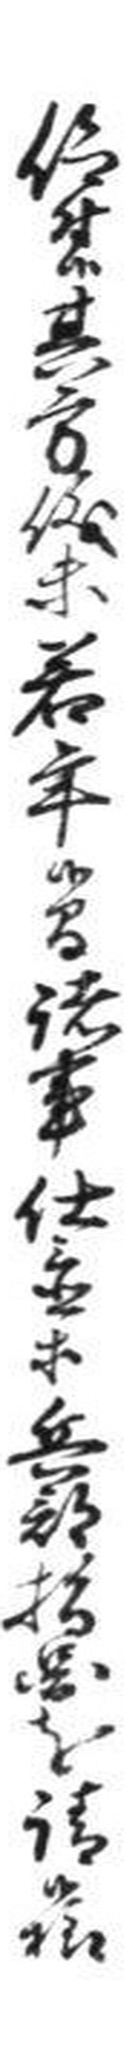仰付候其方儀未若年候間諸事仕置等兵部指図を請候様
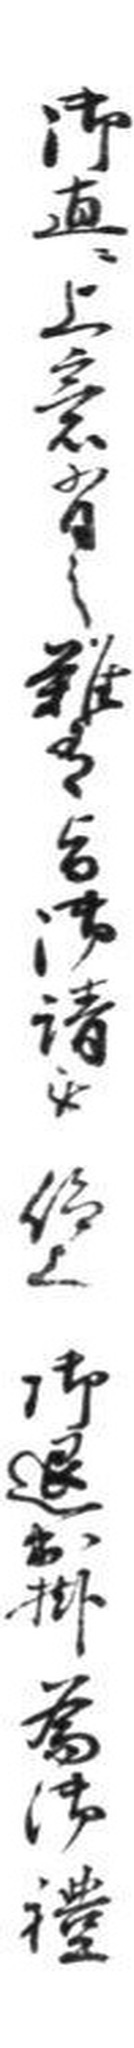御直ニ上意有之難有旨御請被仰上御退出掛為御礼
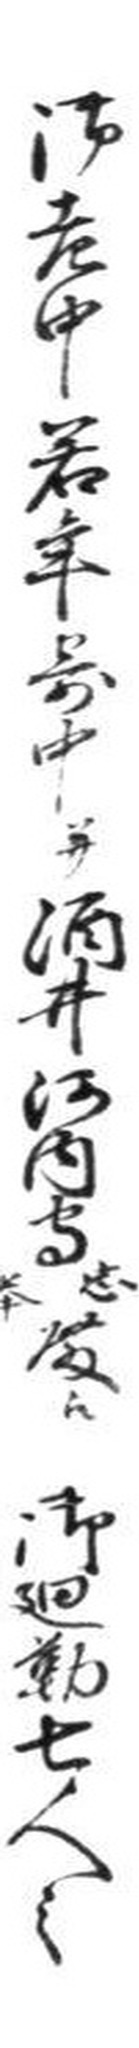御老中若年寄中并酒井河内守忠挙殿江御廻勤七人之
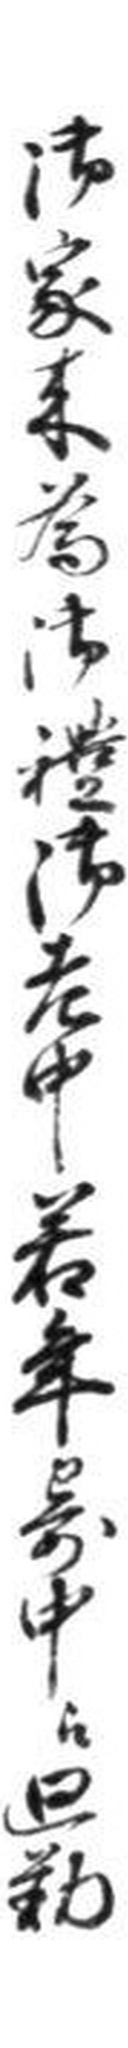御家来為御礼御老中若年寄中江廻勤
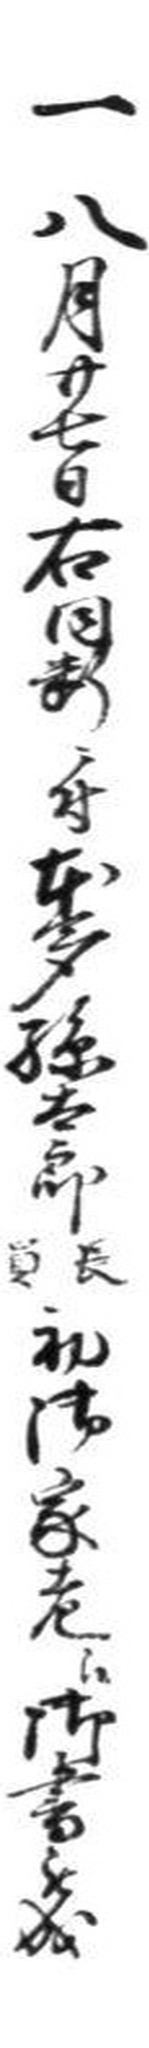一八月廿七日右同断ニ付本多孫太郎長員初御家老江御書被成
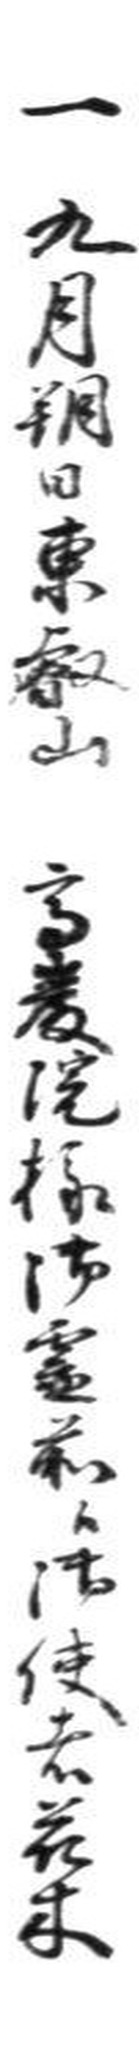一九月朔日東叡山高巌院様御霊前江御使者花木
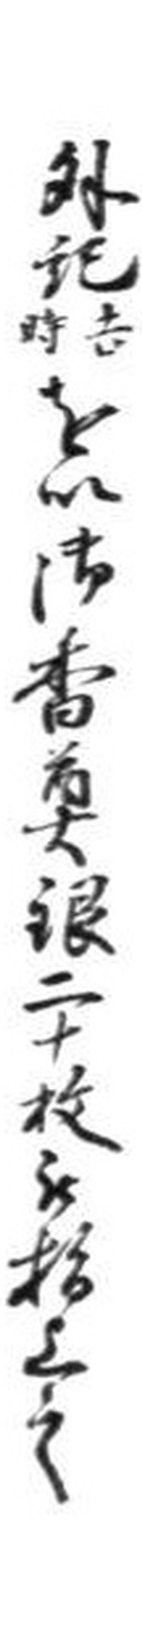外記吉時を以御香奠銀二十枚被指上之
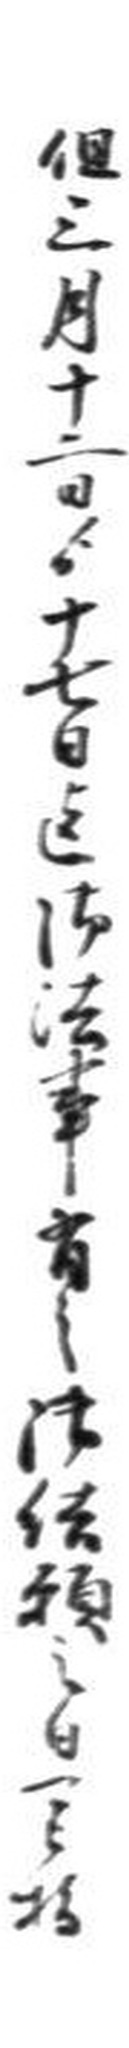但三月十二日ゟ十七日迄御法事有之御結願之日可被指
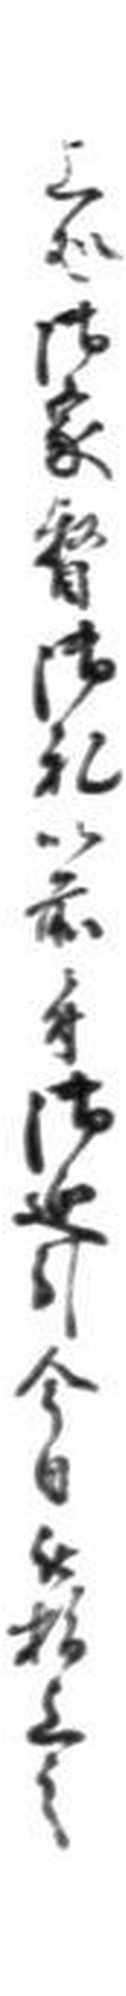上処御家督御礼以前ニ付御延引今日被指上之
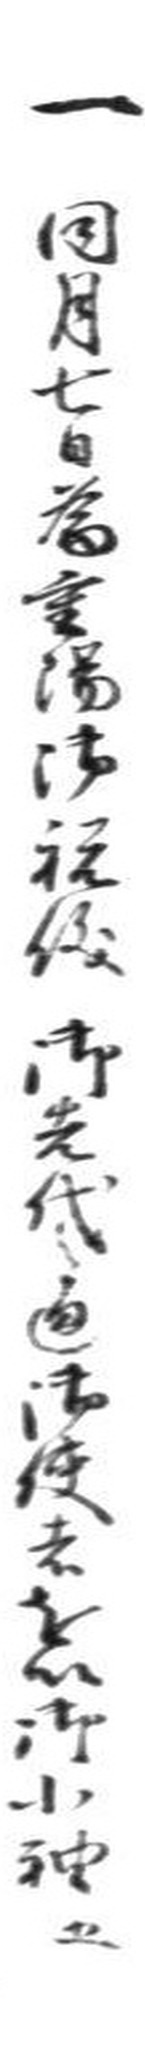一同月七日為重陽御祝儀御先代之通御使者を以御小袖五
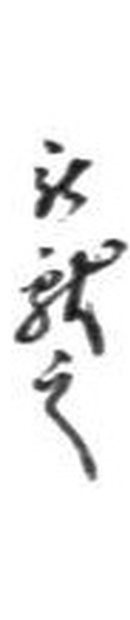被献之
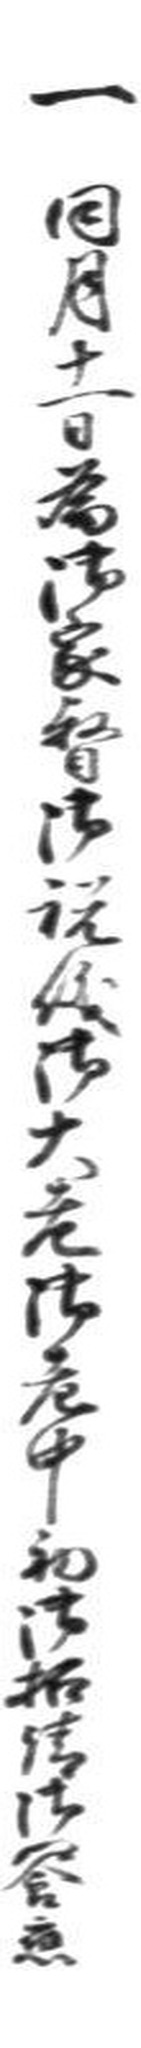一同月十一日為御家督御祝儀御大老御老中初御招請御饗応
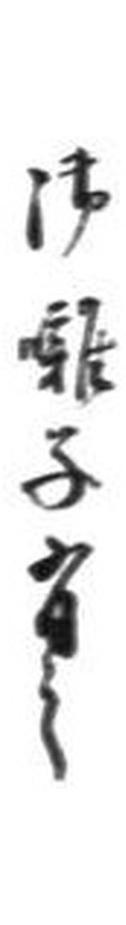御囃子有之
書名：家譜 十三 綱昌公 従寛文元年到延宝五年
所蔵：福井県文書館 Fukui Prefectural Archives
